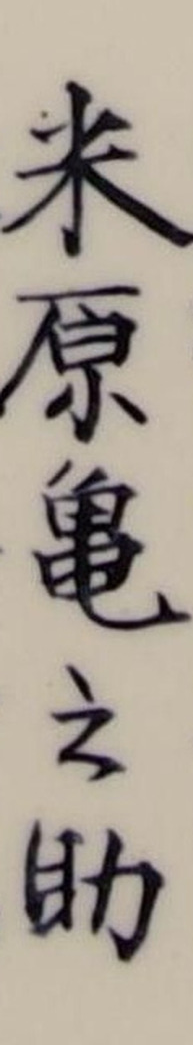米原亀之助
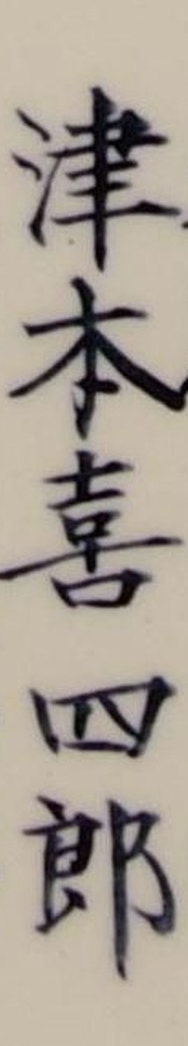津本喜四郎
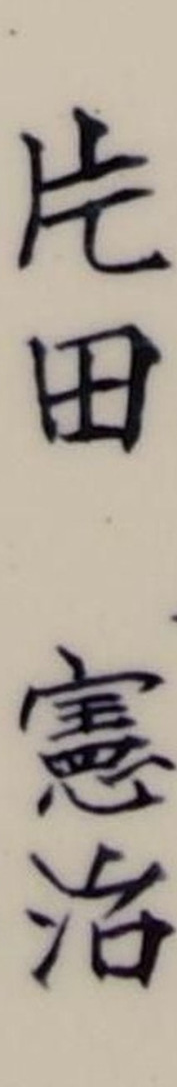片田憲治
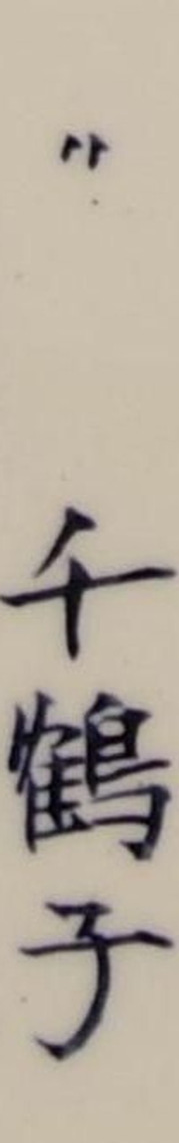千鶴子
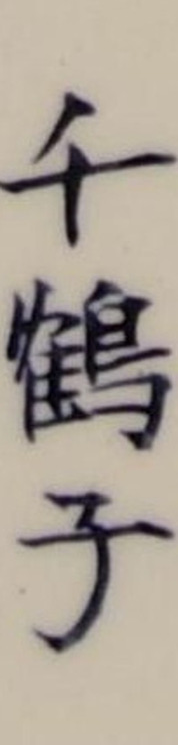千鶴子
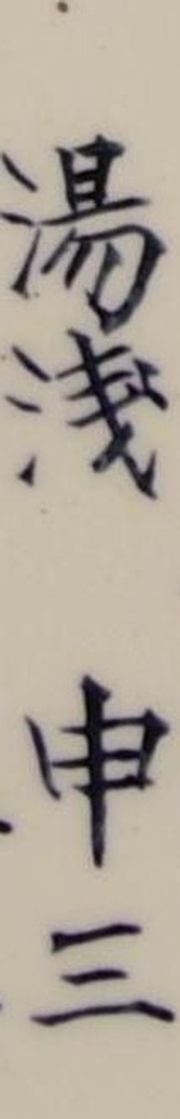湯浅申三
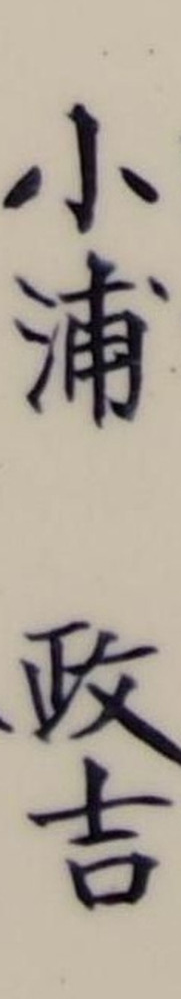小浦政吉
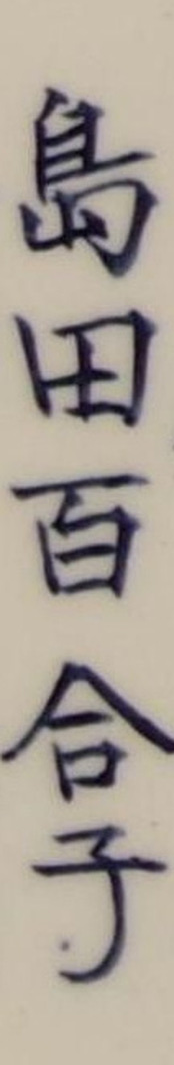島田百合子
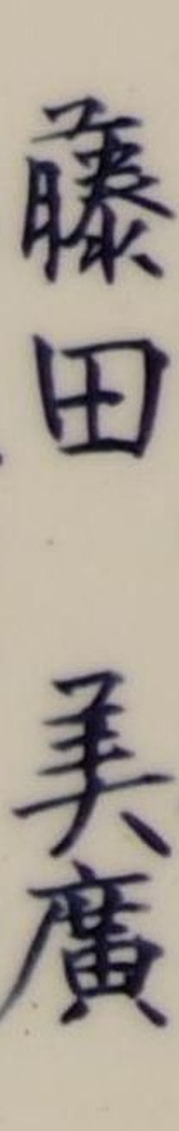藤田美広
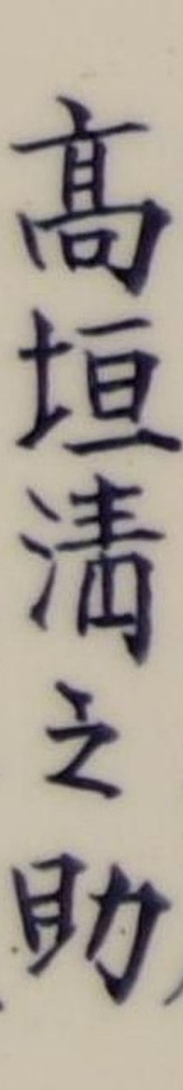高垣清之助
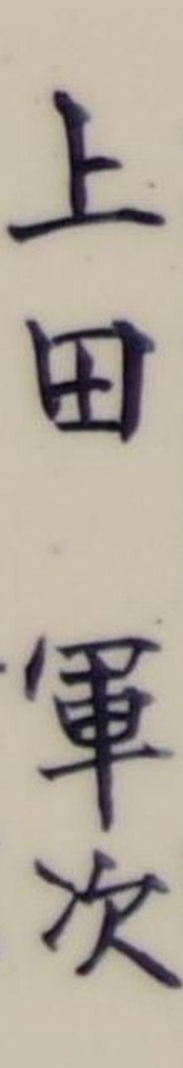上田軍次
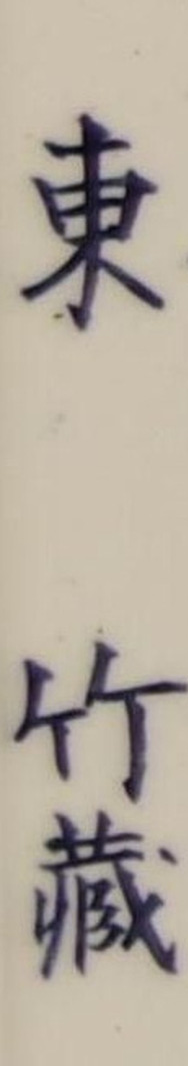東竹蔵

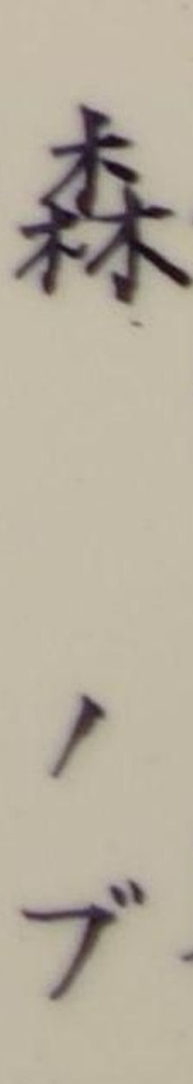森ノブ
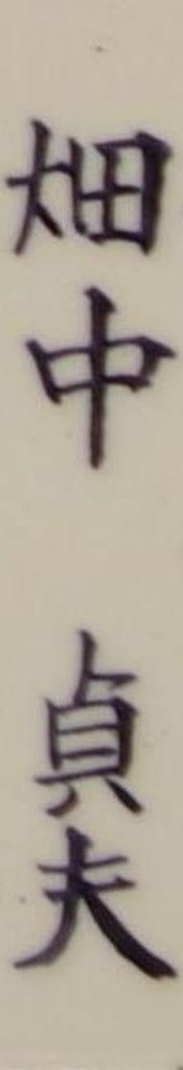畑中貞夫
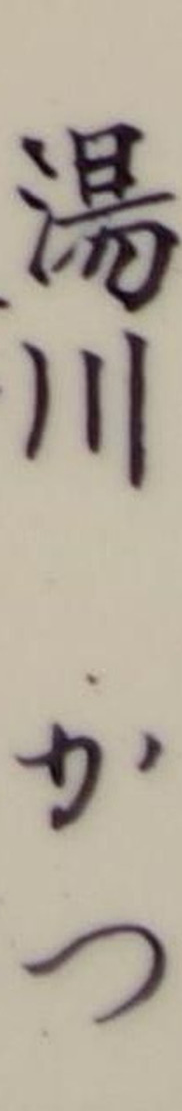湯川かつ
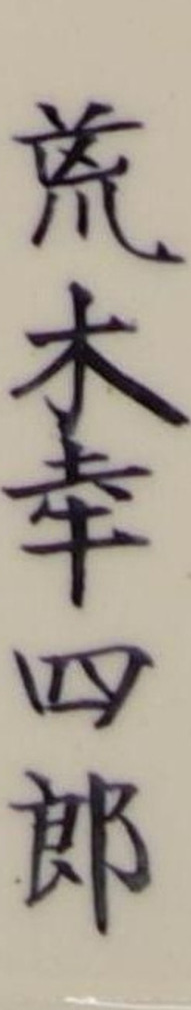荒木幸四郎
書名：E~L
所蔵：高野山金剛峯寺
